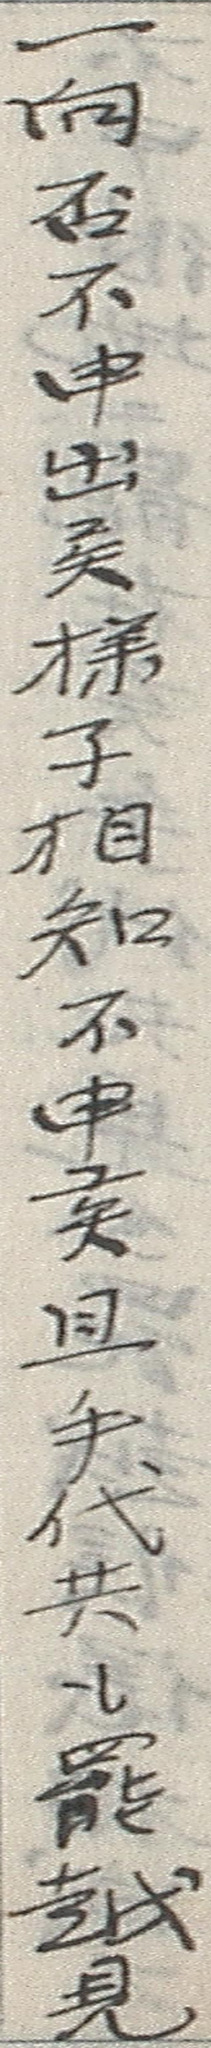一向否不申出候様子相知不申候且手代共も罷越見
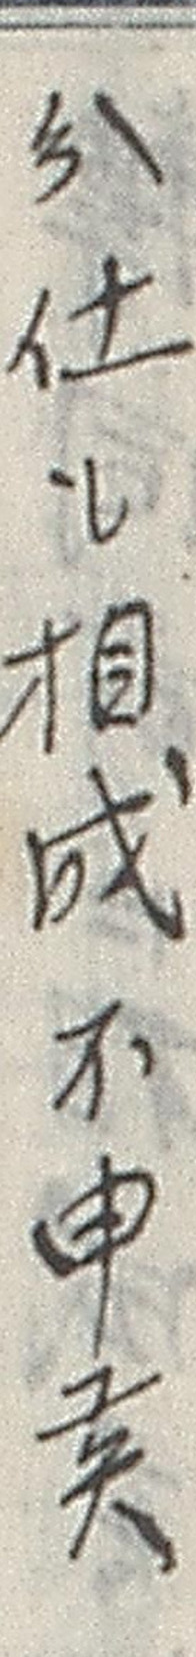分仕も相成不申候
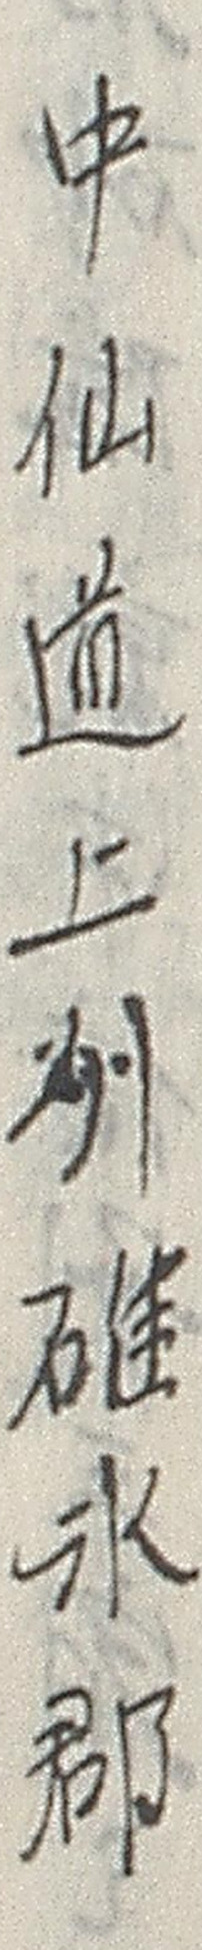中仙道上州碓氷郡
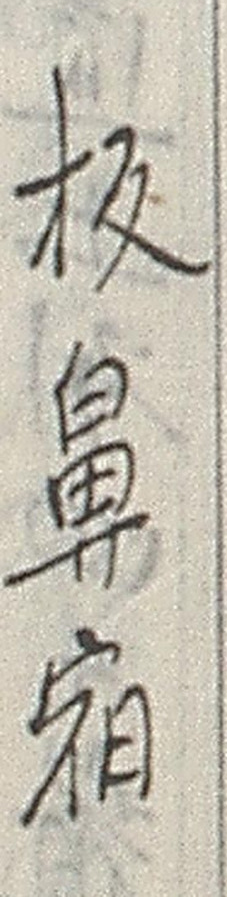板鼻宿
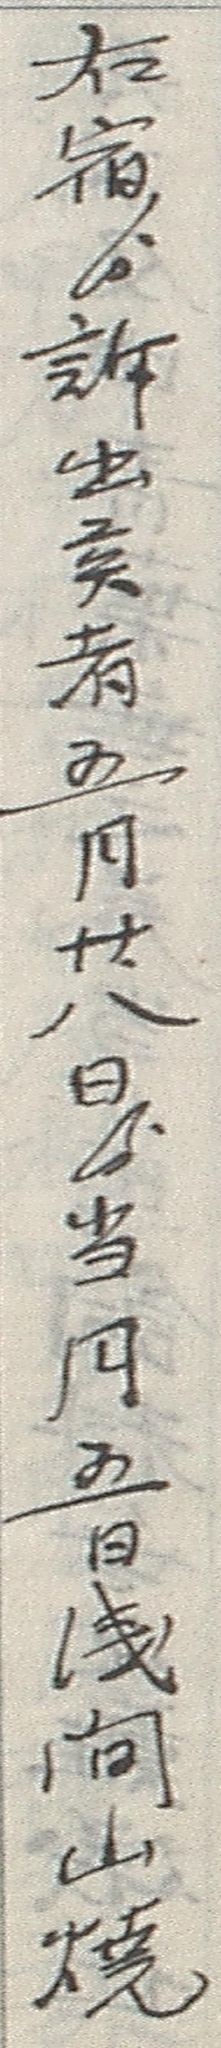右宿ゟ許出候者五月廿八日ゟ当月五日浅間山焼
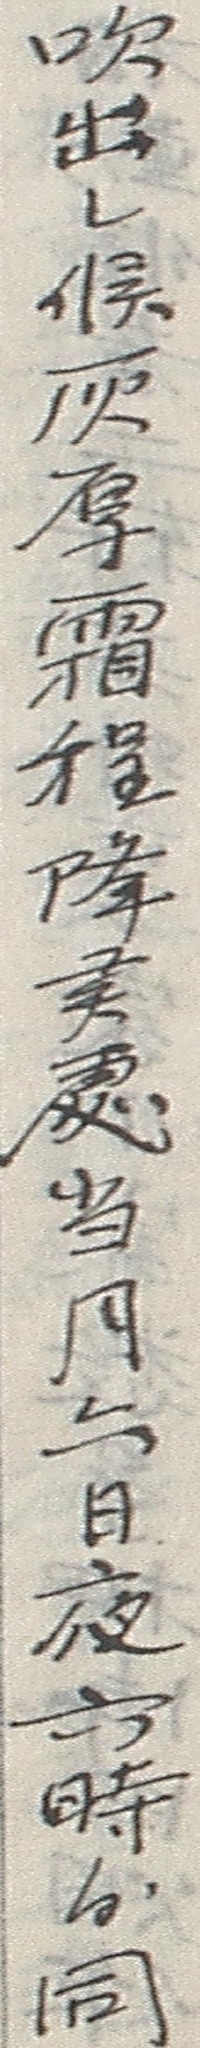吹出し候灰厚霜程降候処当月二日夜六時ゟ同
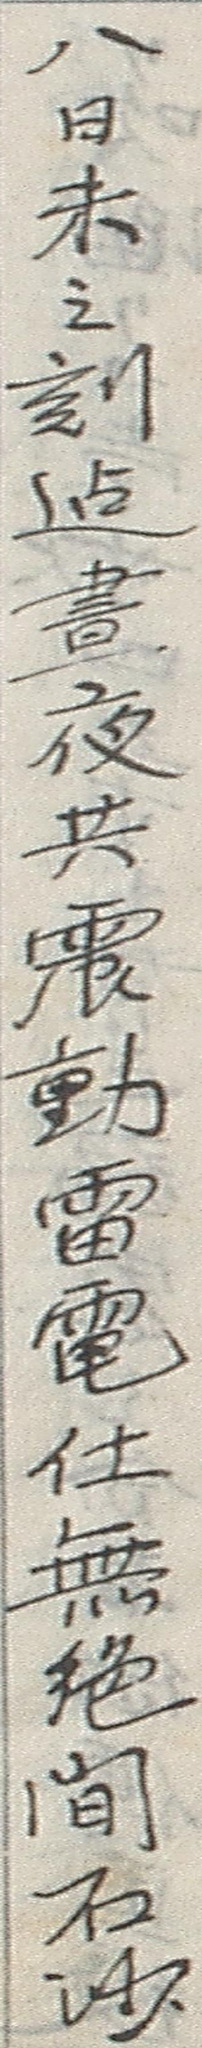八日未之刻迄昼夜共震動雷電仕無絶間石砂
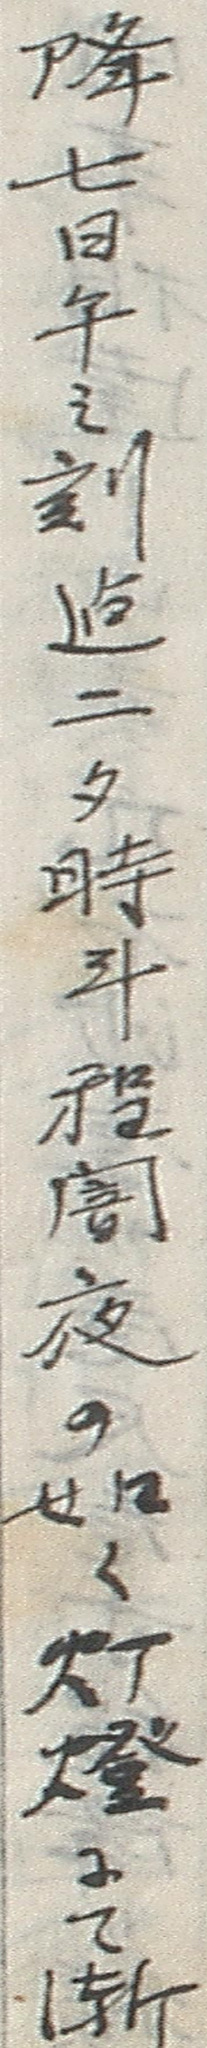降七日午之刻迄二タ時斗程闇夜の如く灯燈にて漸

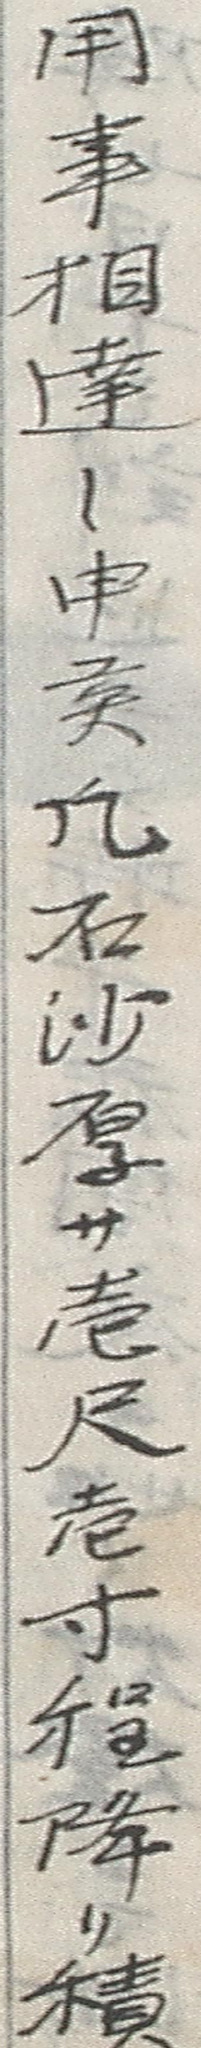用事相達し申候凡石沙厚サ壱尺壱寸程降リ積
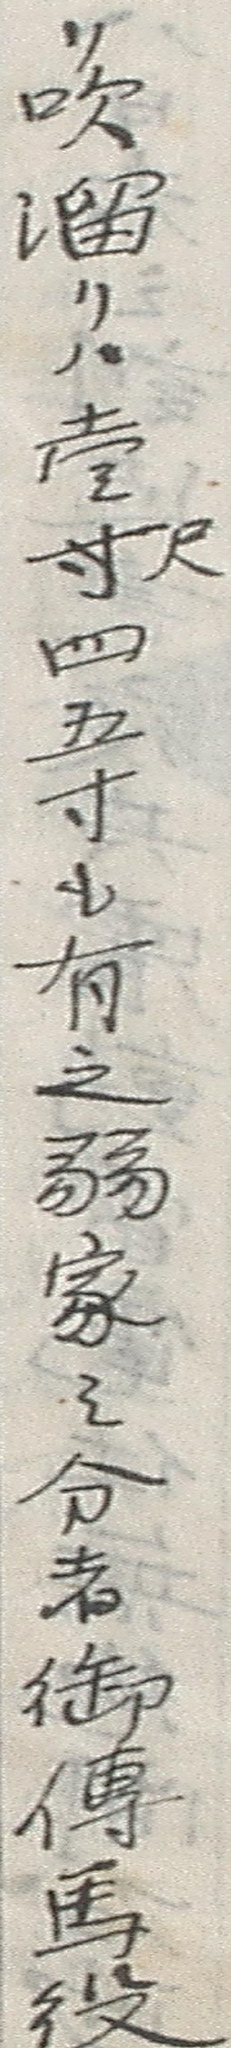リ吹溜リの|尺四五寸も有之弱家之分者御伝馬役
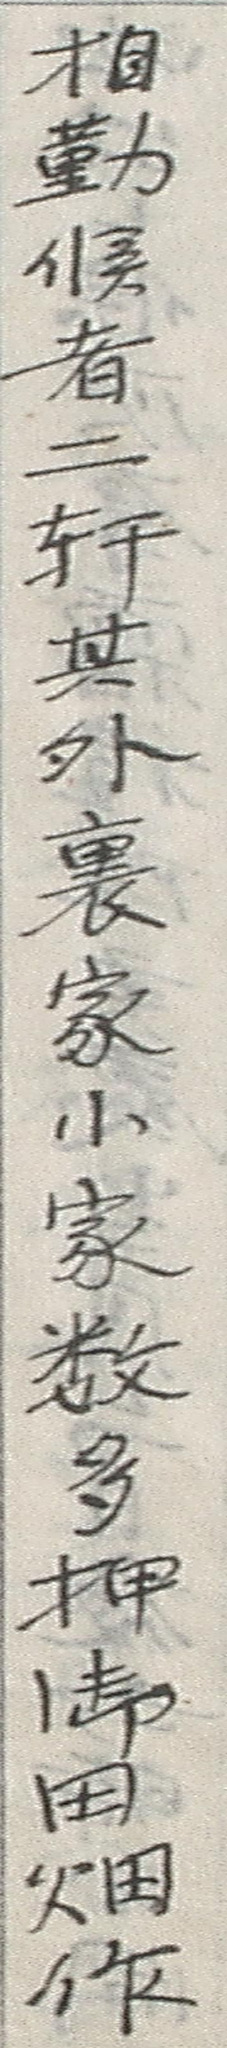相勤候者二軒其外裏家小家数多押御田畑作
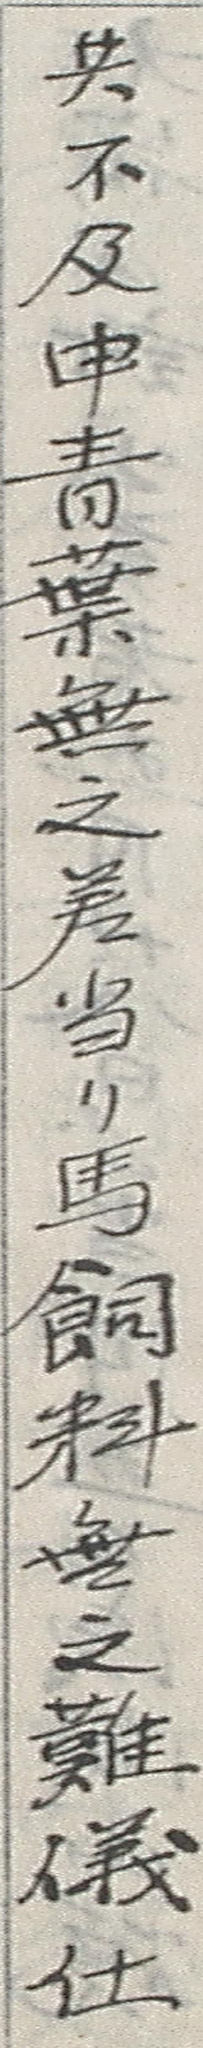共不及申青葉無之差当リ馬飼料無之難儀仕
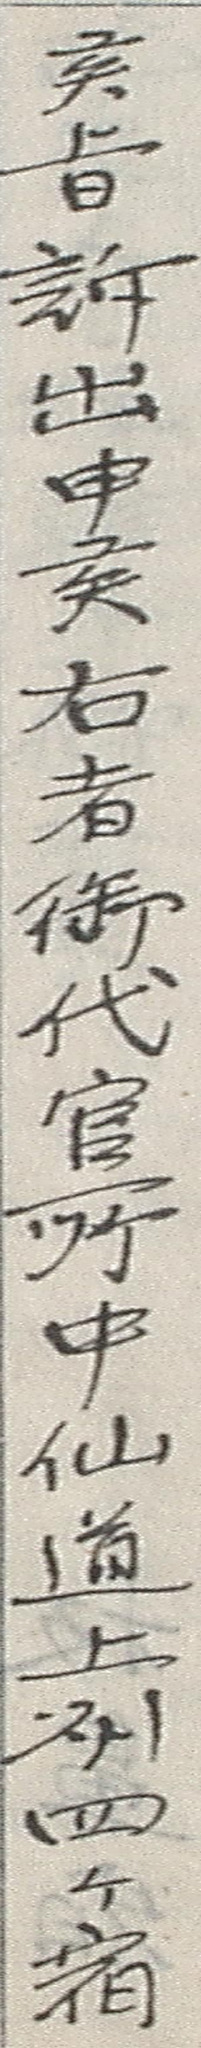候旨訴出申候右者御代官所中仙道上州四ヶ宿
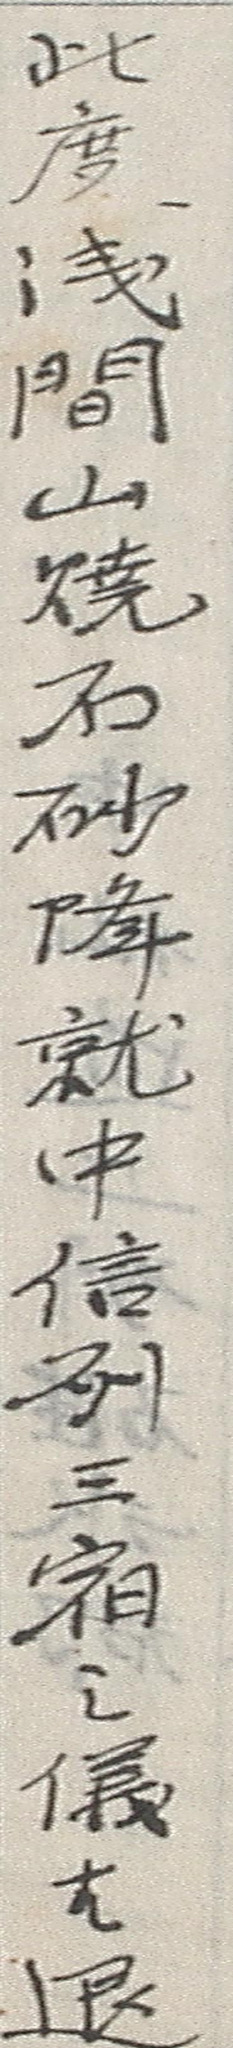此度浅間山焼石砂降就中信州三宿之儀は退
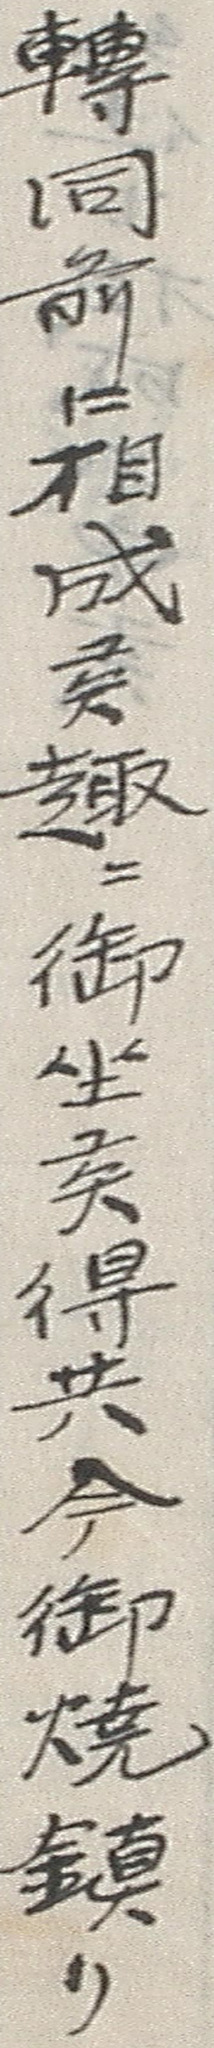転同前に相成候趣二御座候得共今御焼鎮リ
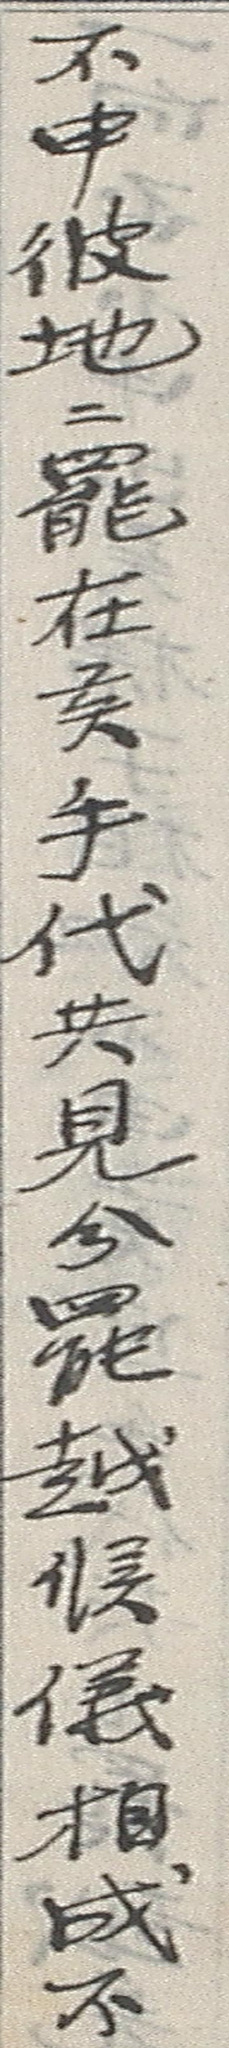不申彼地二罷在候手代共見分罷越候儀相成不
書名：浅間山焼出記
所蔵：東京大学地震研究所図書室 Earthquake Research Institute Library, The University of Tokyo, JAPAN
